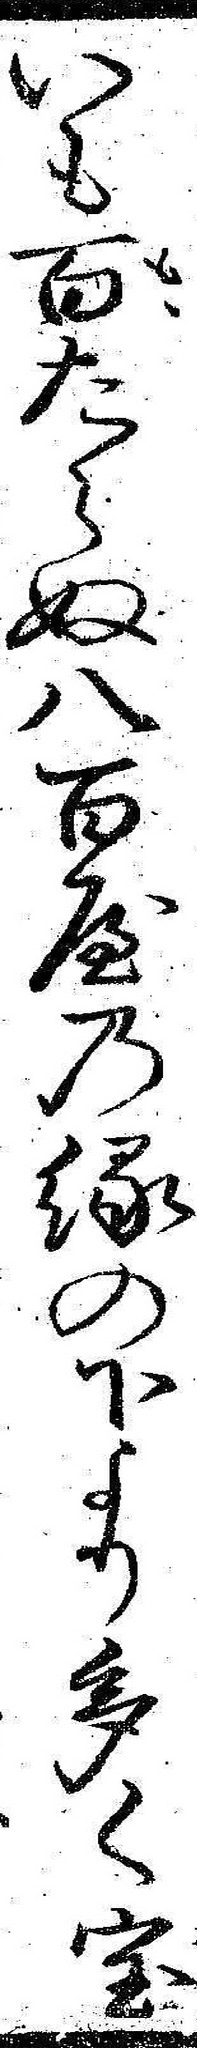いも百たらぬ八百屋の縁の下より多く宝
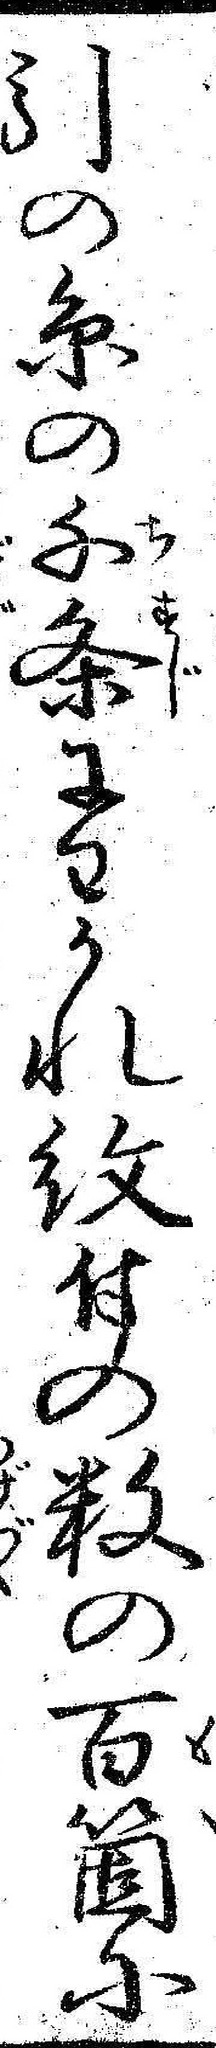引の糸の千条にわかれ紋付の数の百箇に
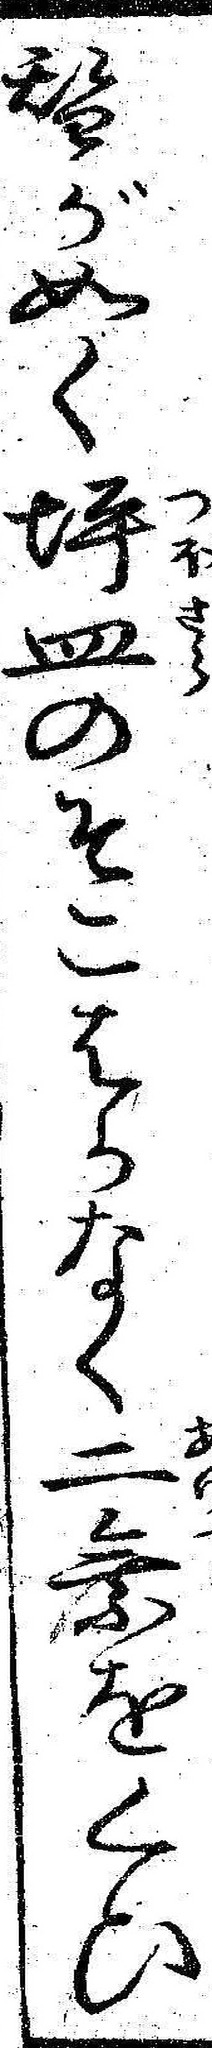替が如く坪皿のそこはかなく二乗をくひ

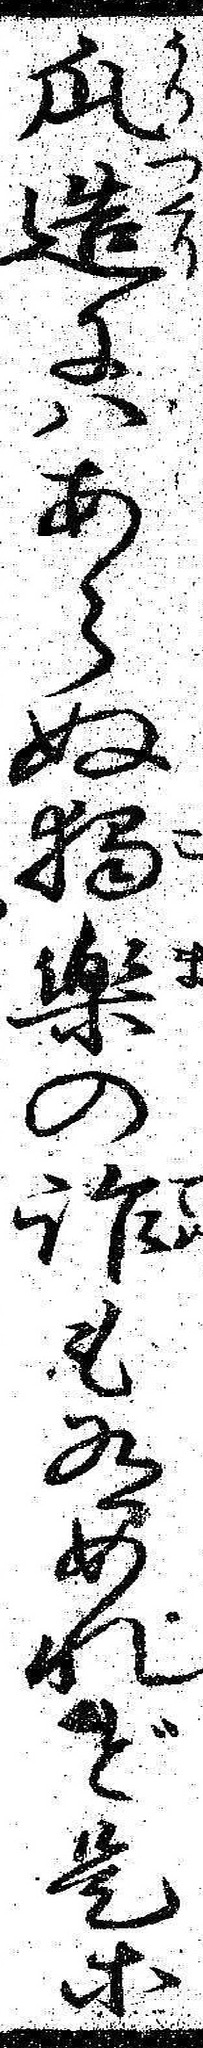瓜造にはあらぬ独楽の詐も有めれど是等
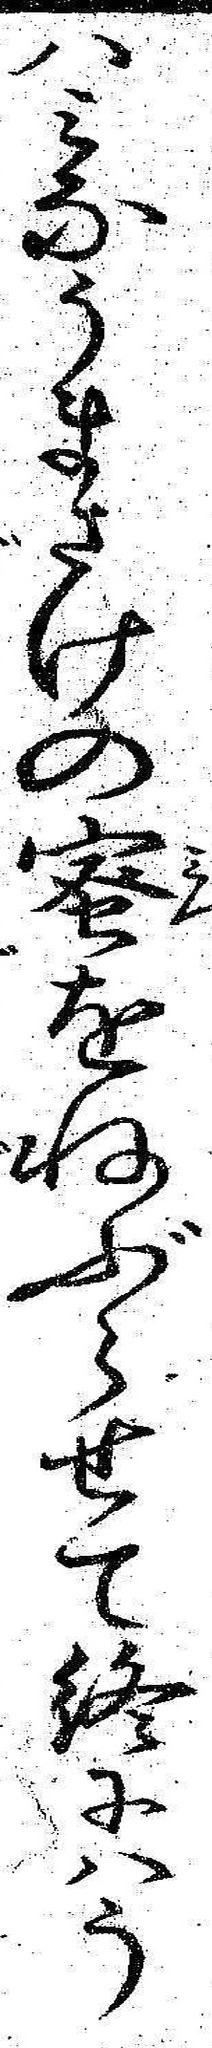はみなうまさけの蜜をねぶらせて終にはう
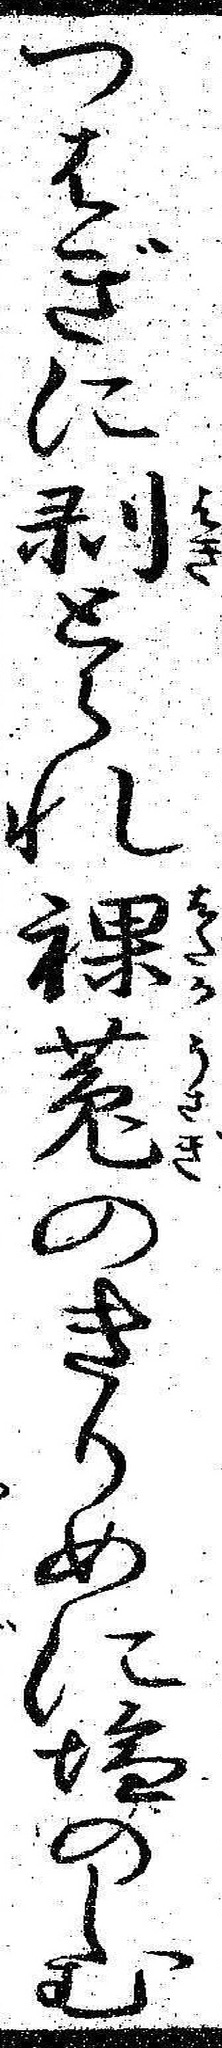つはぎに剥とられ裸菟のきりめに塩のしむ
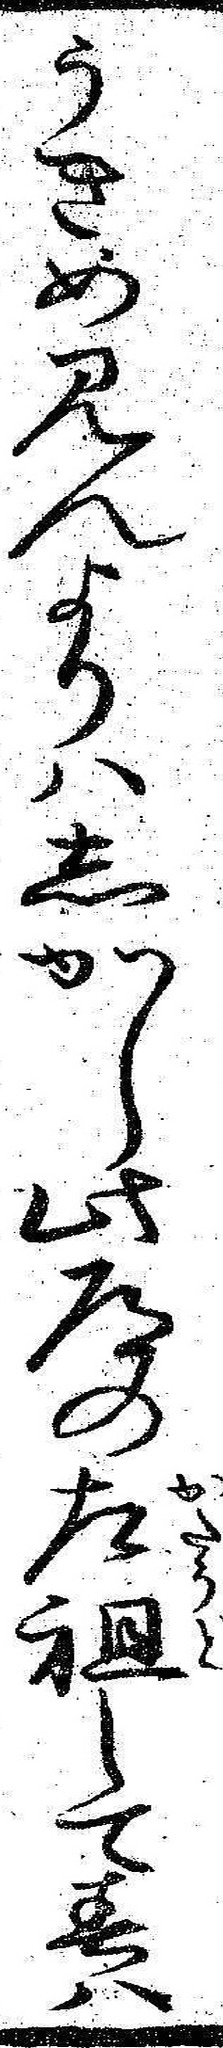うきめ見んよりはしかし此道の左祖して春は
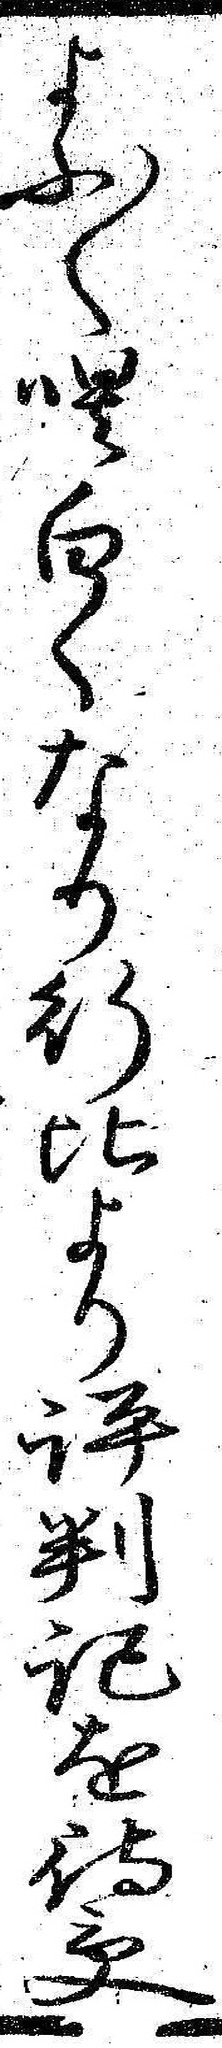よふ〱曙白くなり行比より評判記を待受
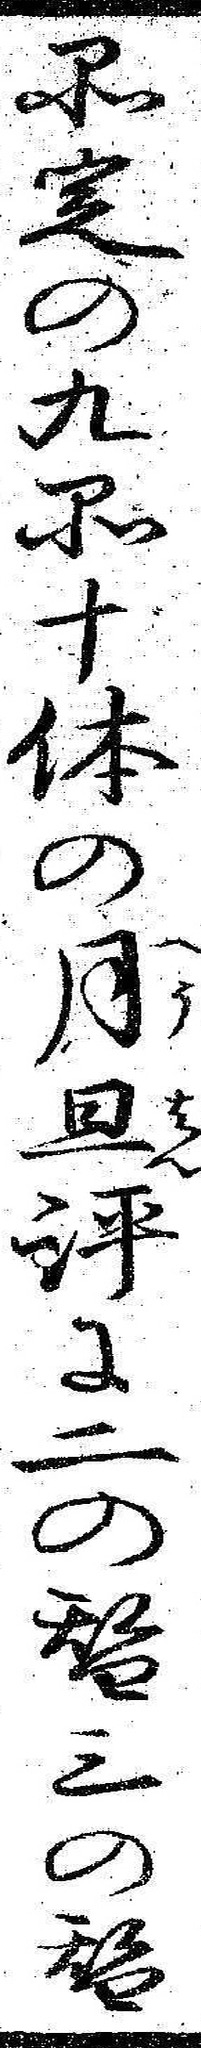品定の九品十体の月旦評に二の替三の替
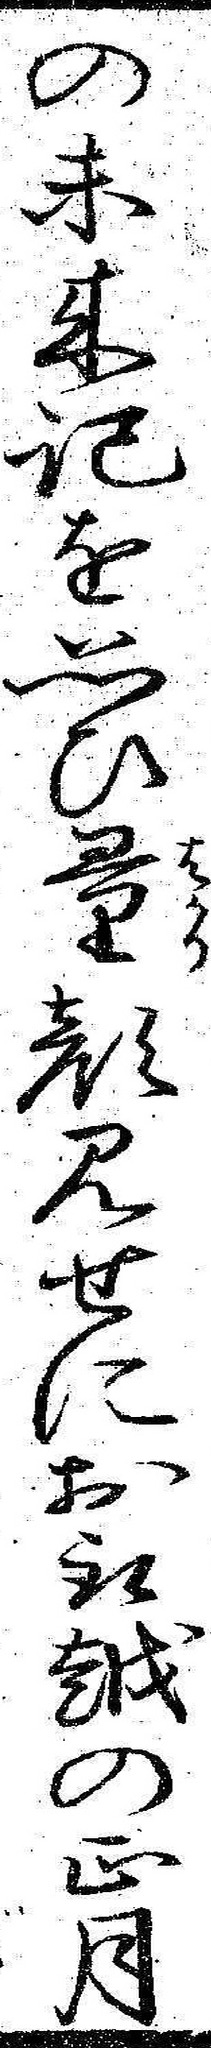の未来記を思ひ量顔見せにお取越の正月
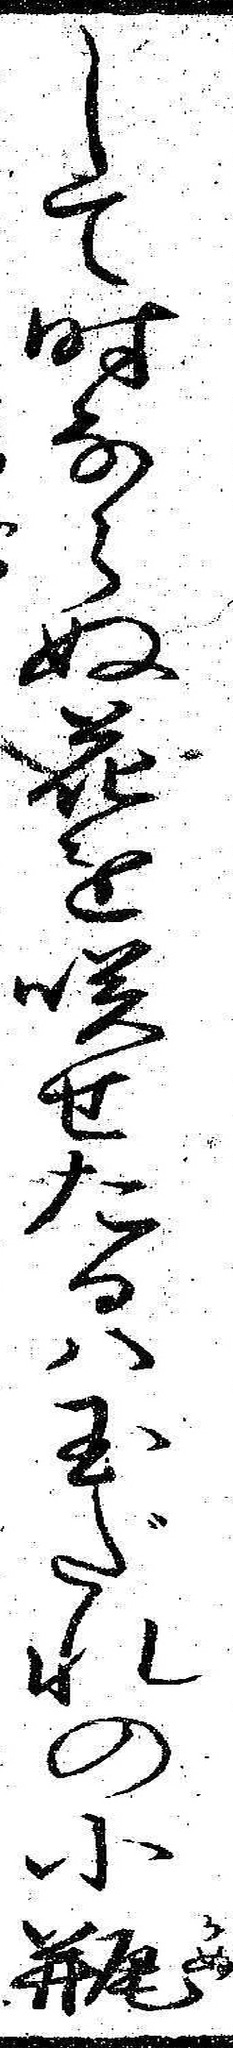して時ならぬ花を咲せたるは玉だれの小瓶
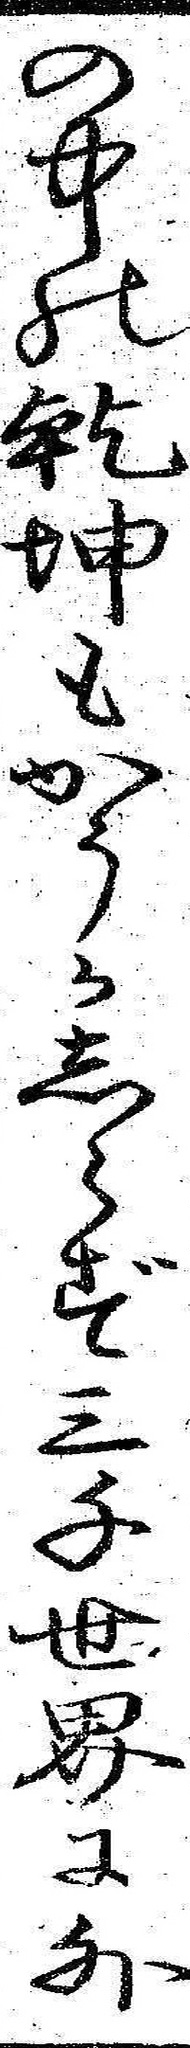の中の乾坤もかうかしらず三千世界に外
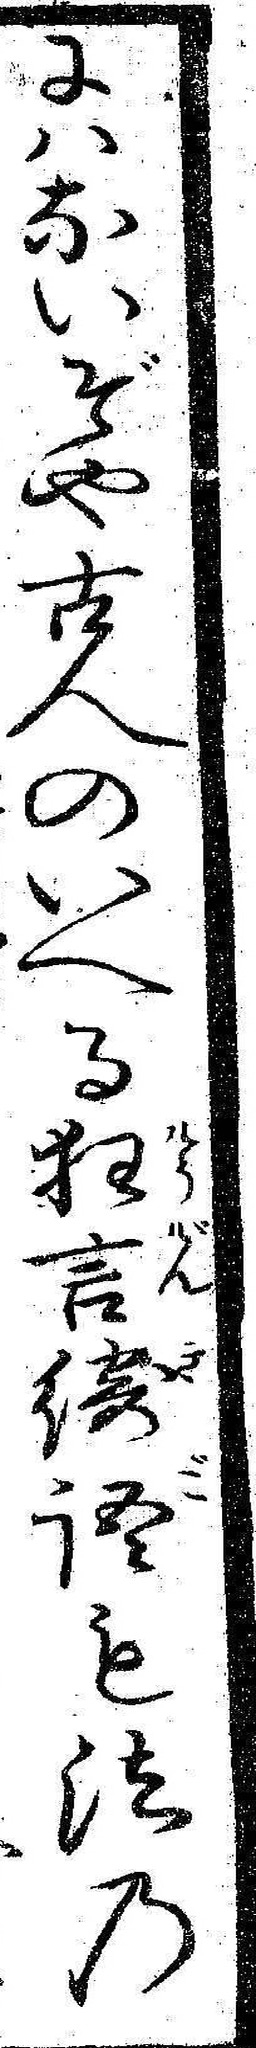にはないぞや古人のいへる狂言綺語も法の
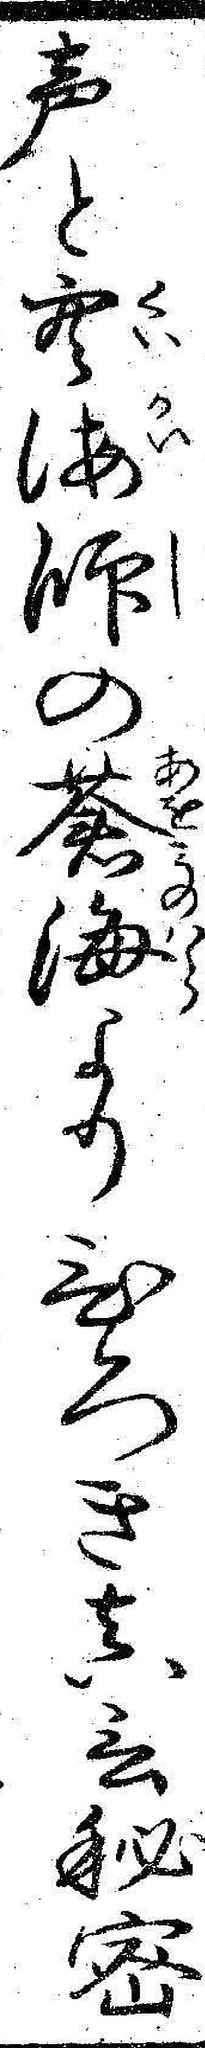声と空海師の蒼海よりひろき真言秘密
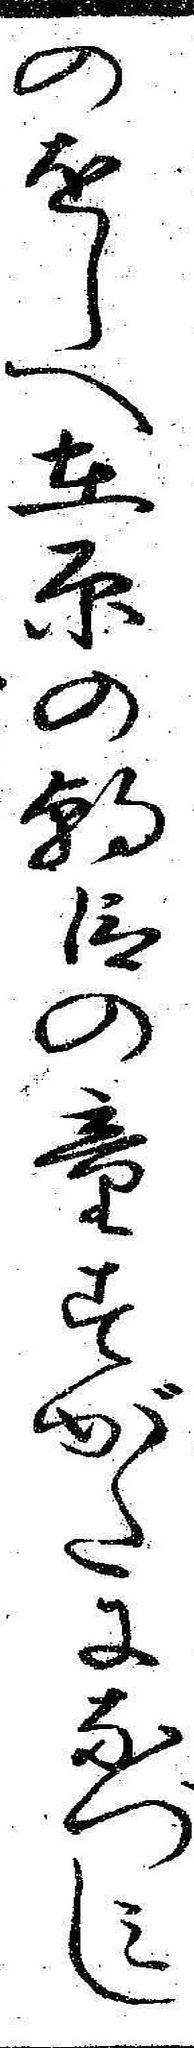のをしへ在原の朝臣の童すがたになづみし
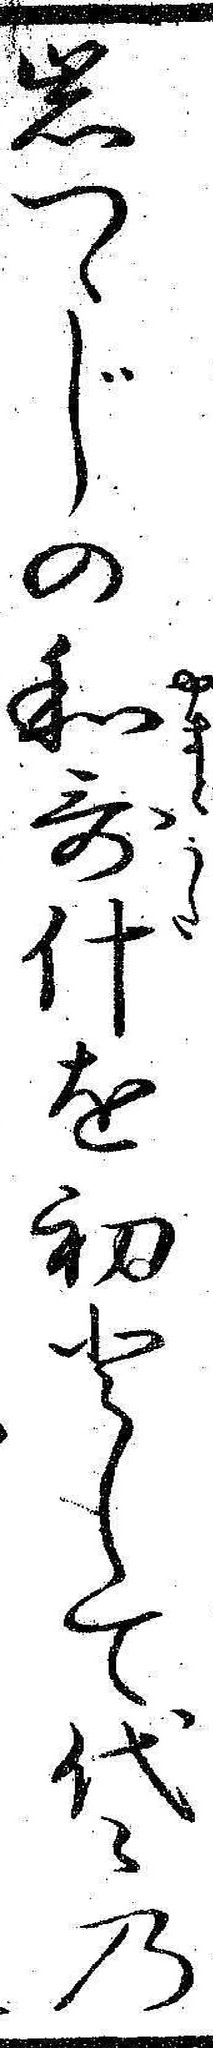岩つゝじの和哥什を初として代々の
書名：根無草後編
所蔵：国文学研究資料館
